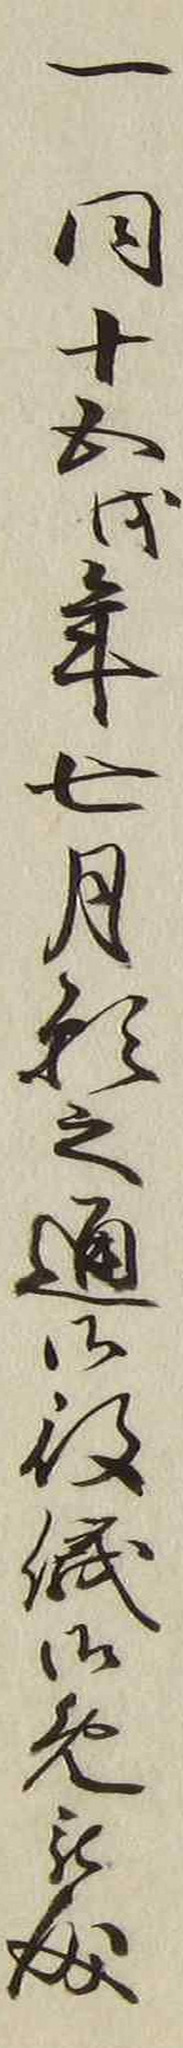一同十五戌年七月願之通御役儀御免被成

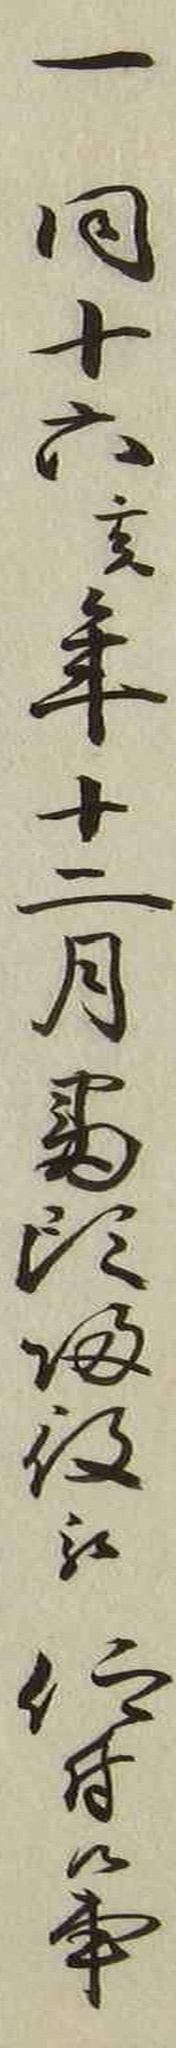一同十六亥年十二月番頭帰役被仰付候事
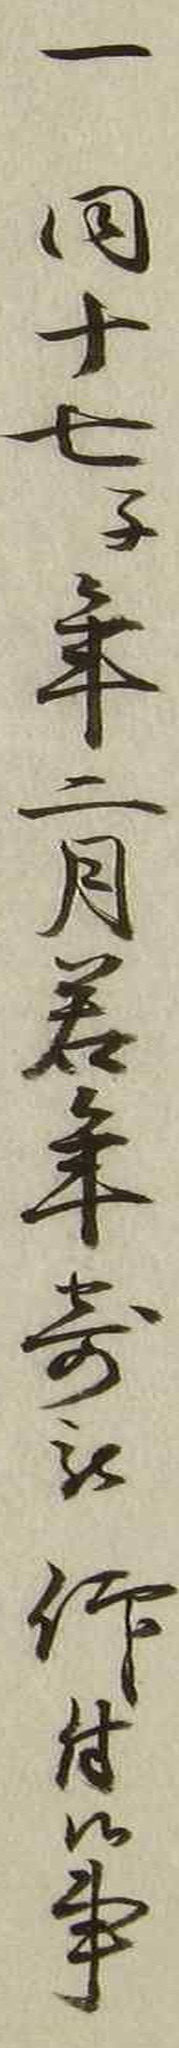一同十七子年二月若年寄被仰付候事
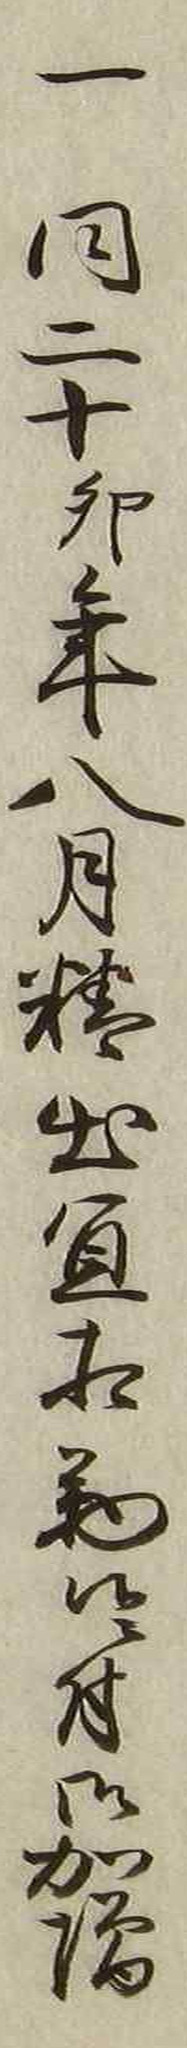一同二十卯年八月精出宜相勤候ニ付御加増
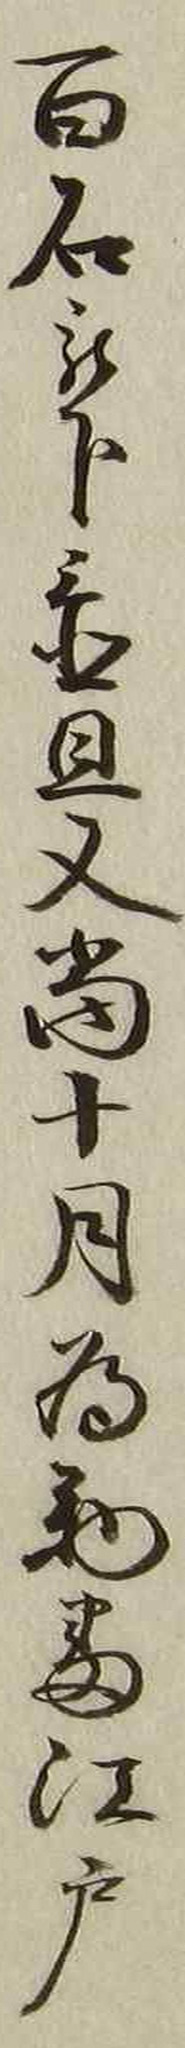百石被下置且又当十月為勤番江戸
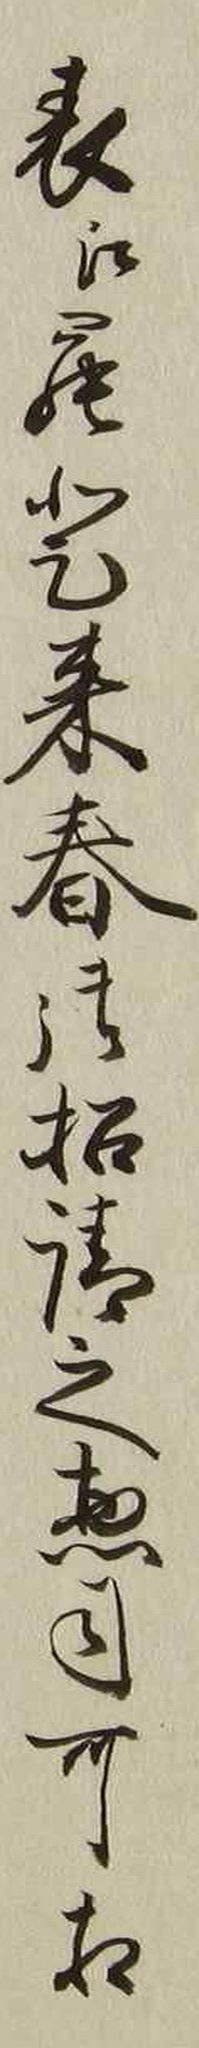表江罷登来春御招請之惣司可相
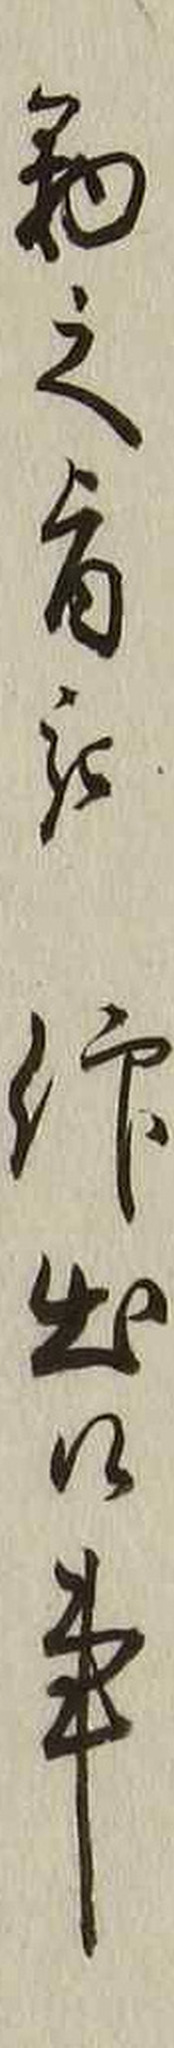勤之旨被仰出候事
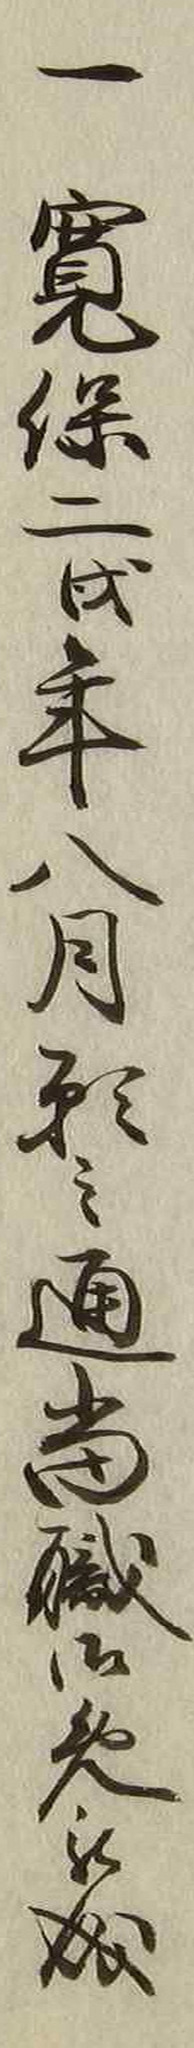一寛保二戌年八月願之通当職御被成
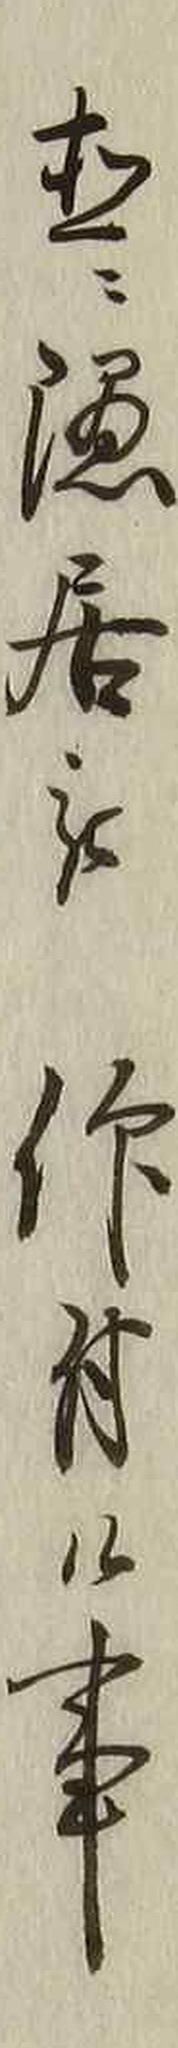直ニ隠居被仰付候事
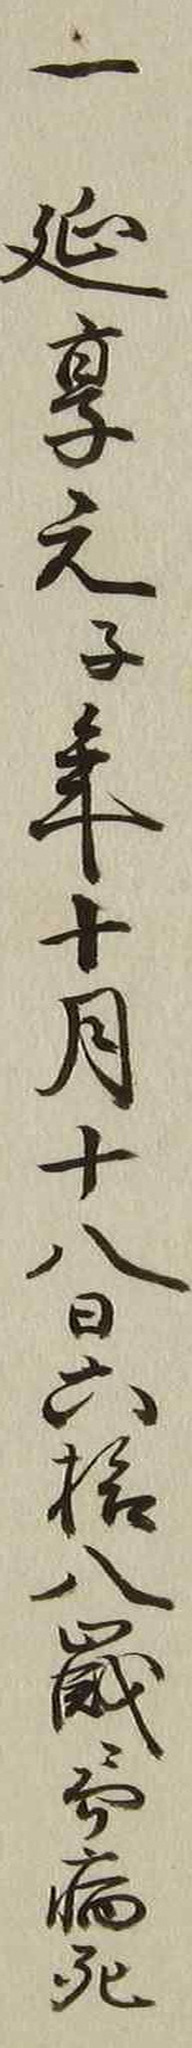一延享元子年十月十八日六拾八歳ニ而病死
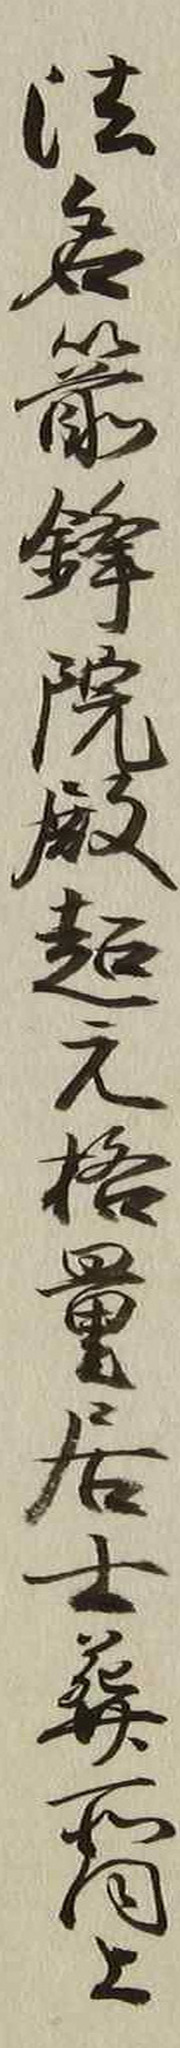法名箭鋒院殿超元格量居士葬所同上
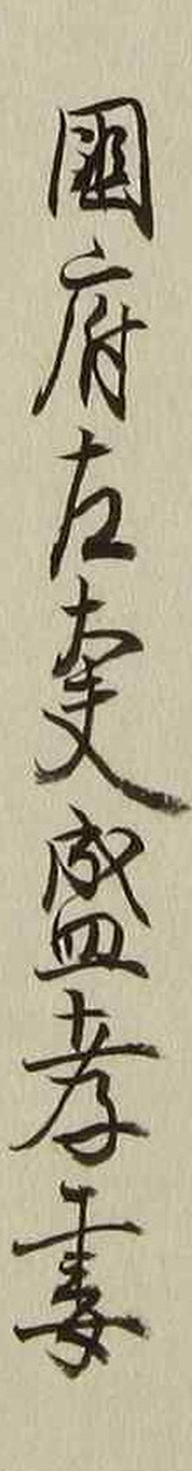女国府左大夫盛孝妻
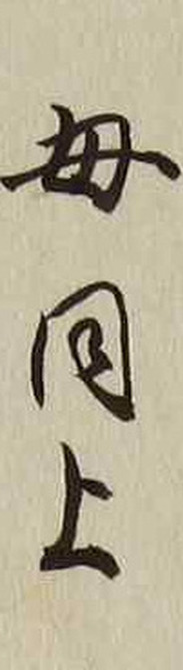母同上
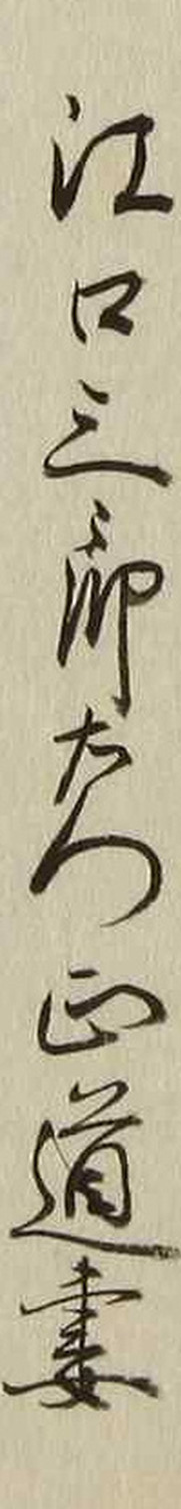女江口三郎右衛門正道妻
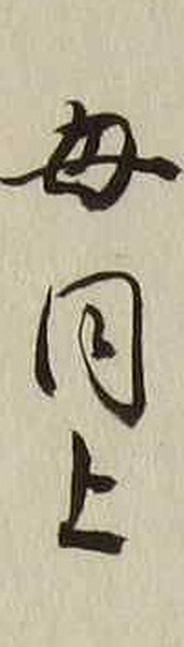母同上
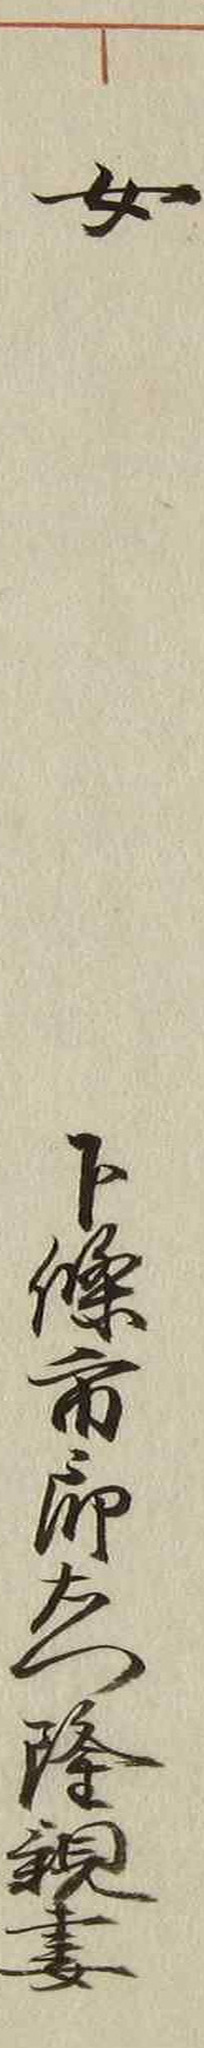女下条市郎右衛門隆親妻
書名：諸士系譜　巻之15　い之部15
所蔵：会津若松市立会津図書館
